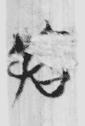{弔口}
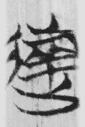{辶止㚔}
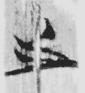之
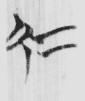𡰥
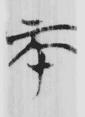帀
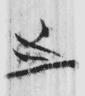之
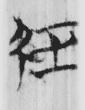佢
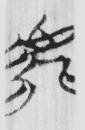鹿
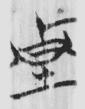{卜？土}
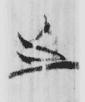之
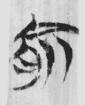俞
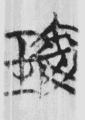{王爾}
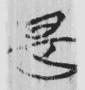是
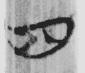四
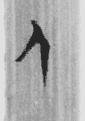人
